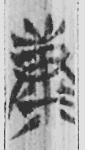康
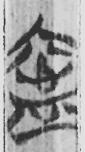{穴心皿}（寧）
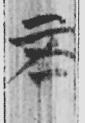不
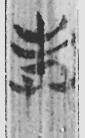奉
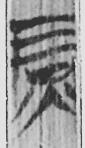庶
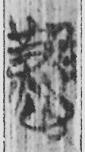戁（難）
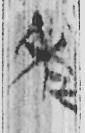年
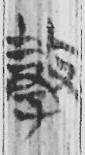{㱿子}
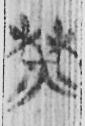焚
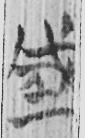成
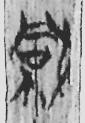風
